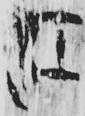江
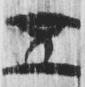五
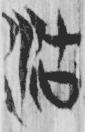沽（湖）
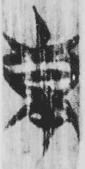東
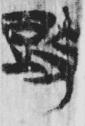○（注）
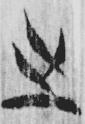之
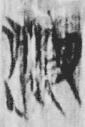○（海）
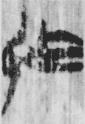於
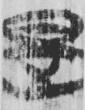是
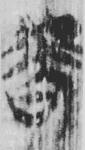唬（乎）
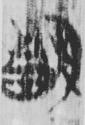○（荊）
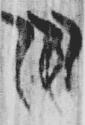州
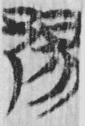○（揚）
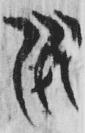州
